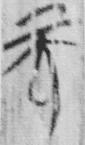而
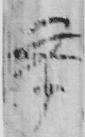不
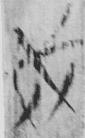戔
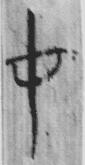才（哉）
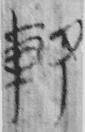○（范）
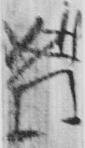乘
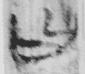曰
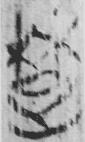楚
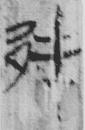邦
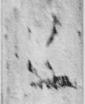之
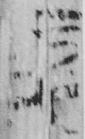𠁩
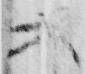又（有）
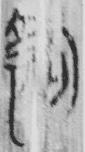飤
